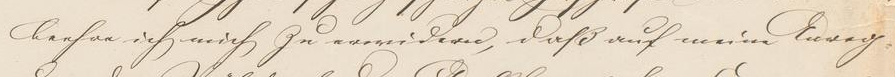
beehre ich mich zu erwidern, daß auf meine Anreg-
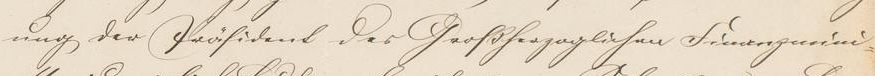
ung der Präsident des Großherzoglichen Finanzmini-
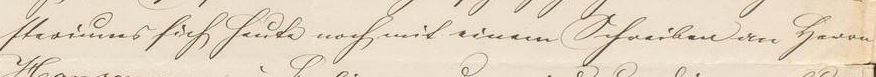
steriums sich heute noch mit einem Schreiben an Herrn
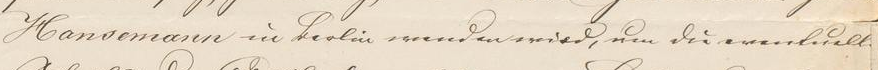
Hansemann in Berlin wenden wird, um die eventuellen
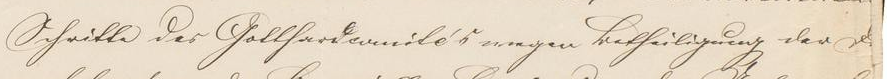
Schritte des Gotthard comite's wegen Betheiligung der Dis-
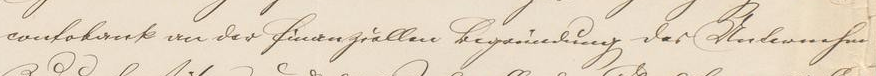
contobank an der finanziellen Begründung des Unternehmens
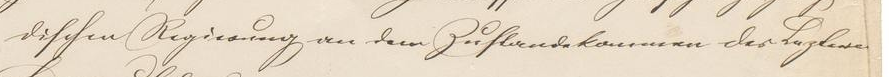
dischen Regierung an dem Zustandekommen der Lezteren
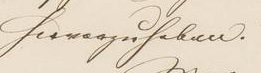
hervorzuheben.
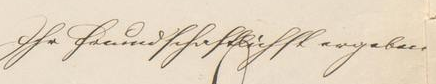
Ihr freundschaftlichst ergebener
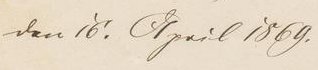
den 16. April 1869.
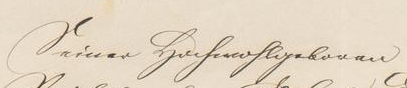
Seiner Hochwohlgeboren
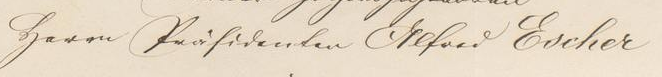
Herrn Präsidenten Alfred Escher
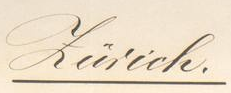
Zürich.
